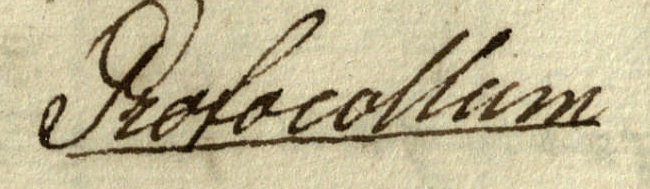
Protocollum
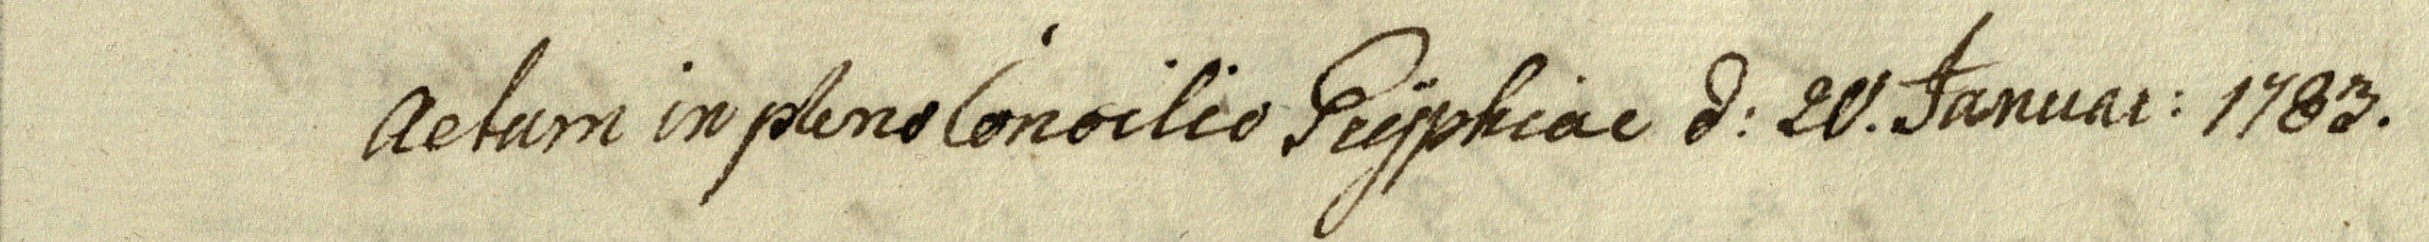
Actum in pleno Concilio Grÿphiae d. 20. Januar. 1783
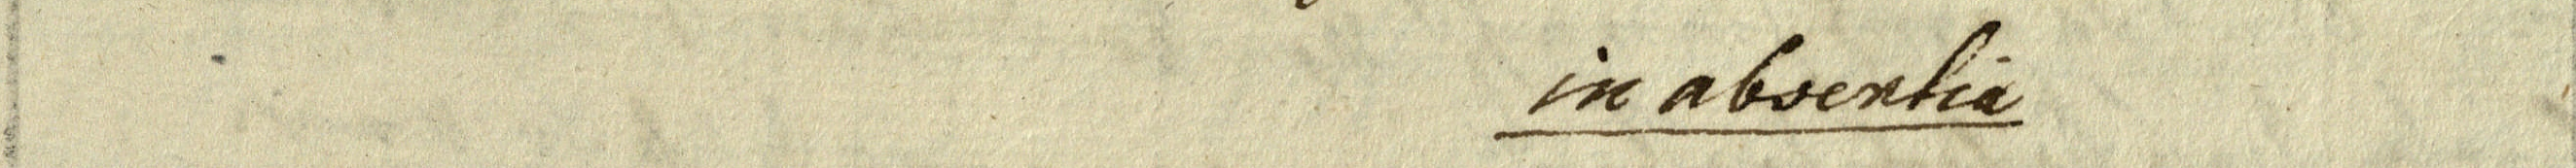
in absentia
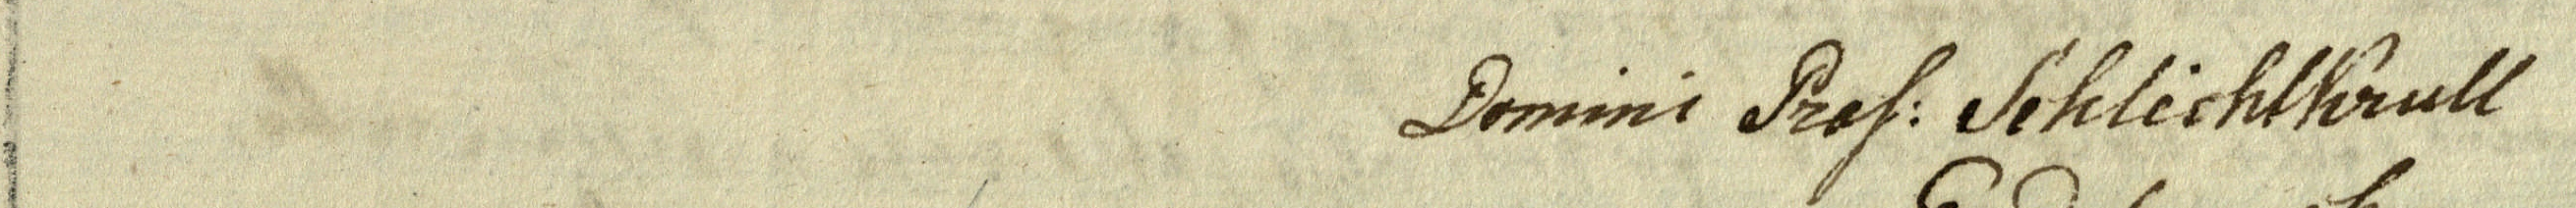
Domini Prof. Schlichtkrull
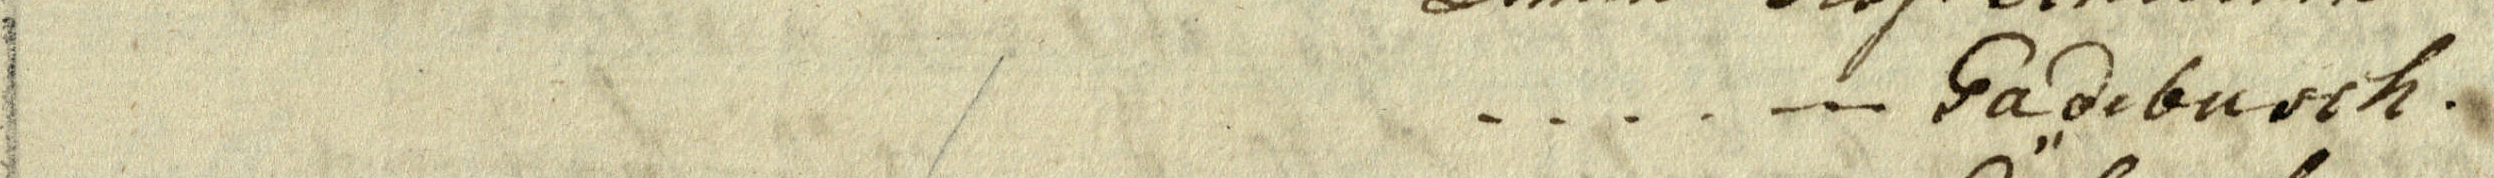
Gadebusch.
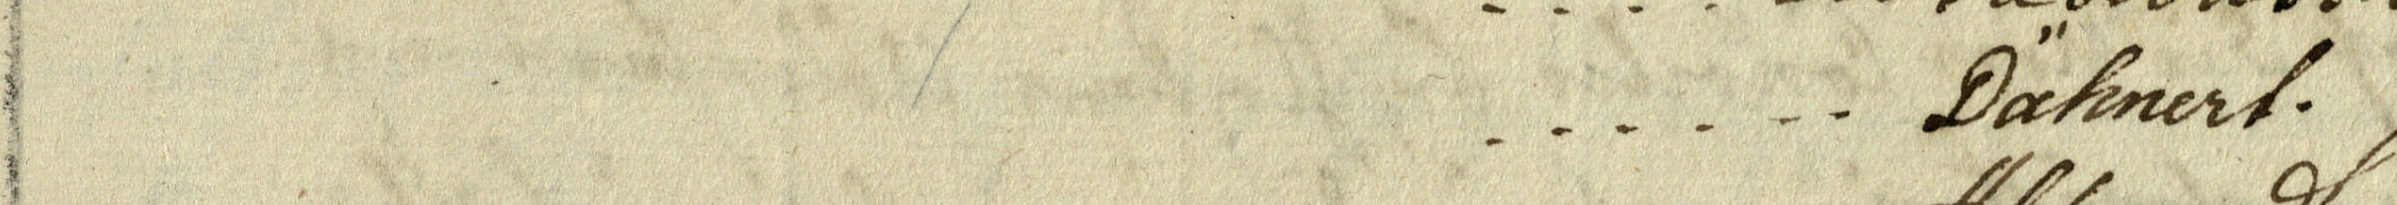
Dähnert.
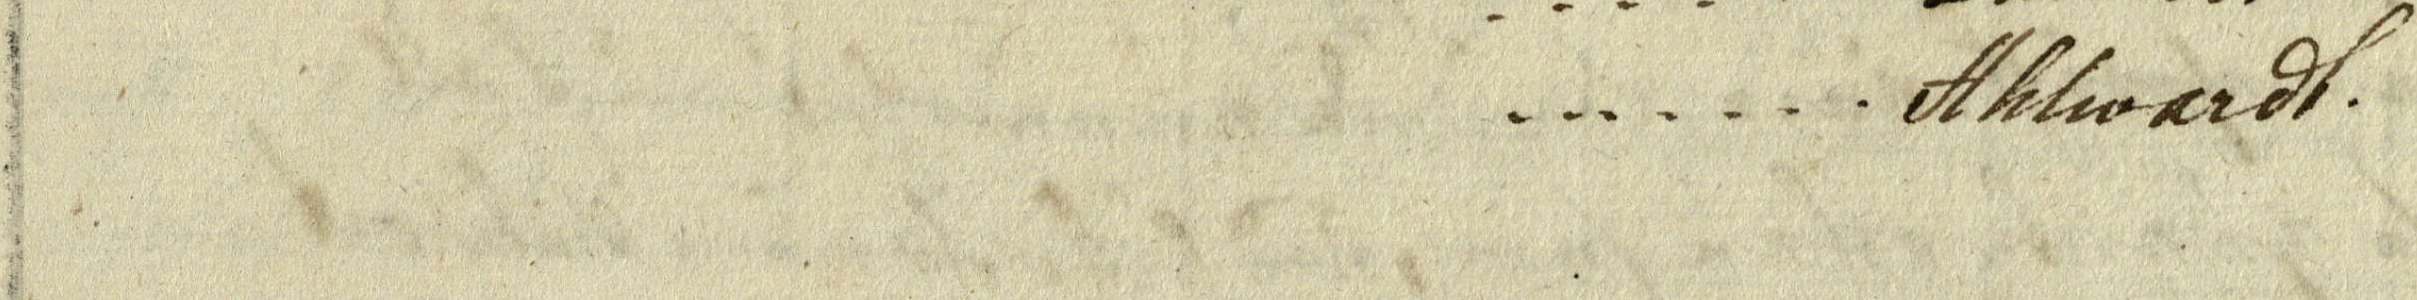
Ahlwardt.
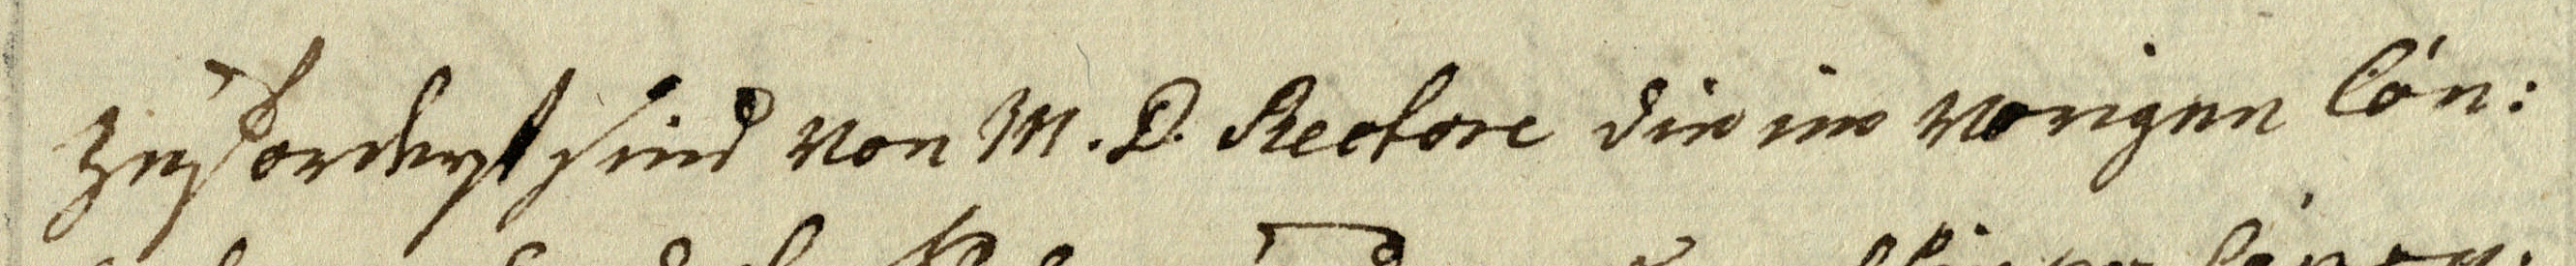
Zuforderst sind von M. D. Rectore die im vorigen Con¬
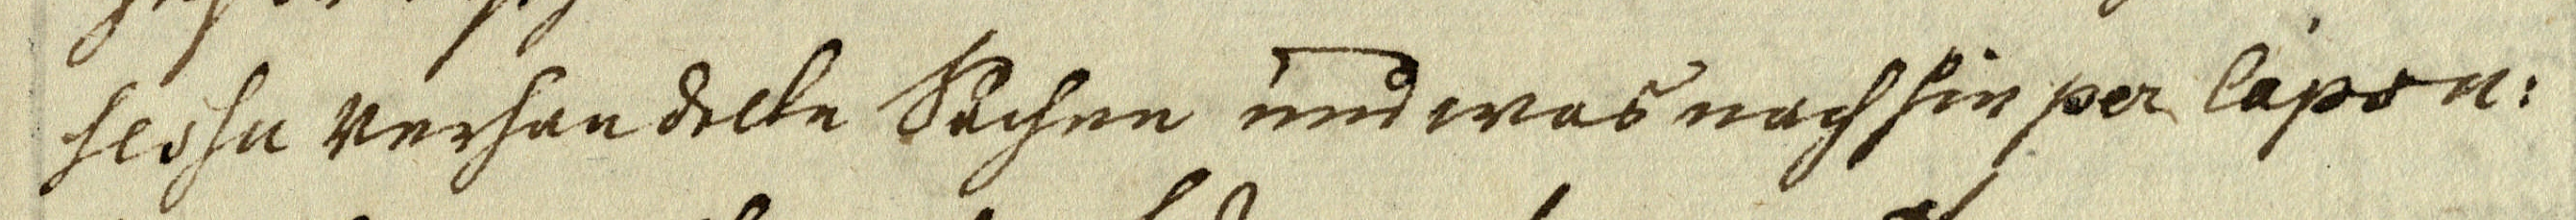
sessu verhandelte Sachen und was nachhin per Capsu¬
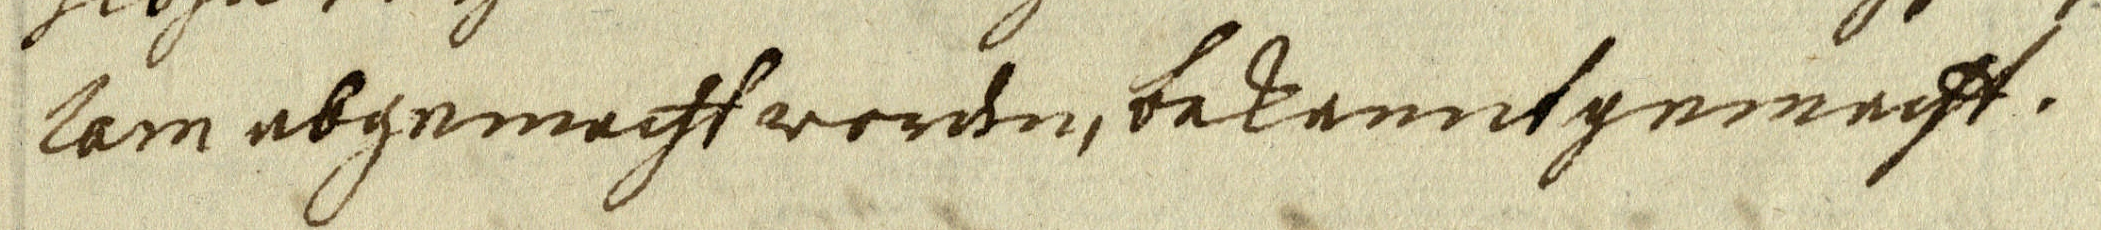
lam abgemacht worden, bekanntgemacht.
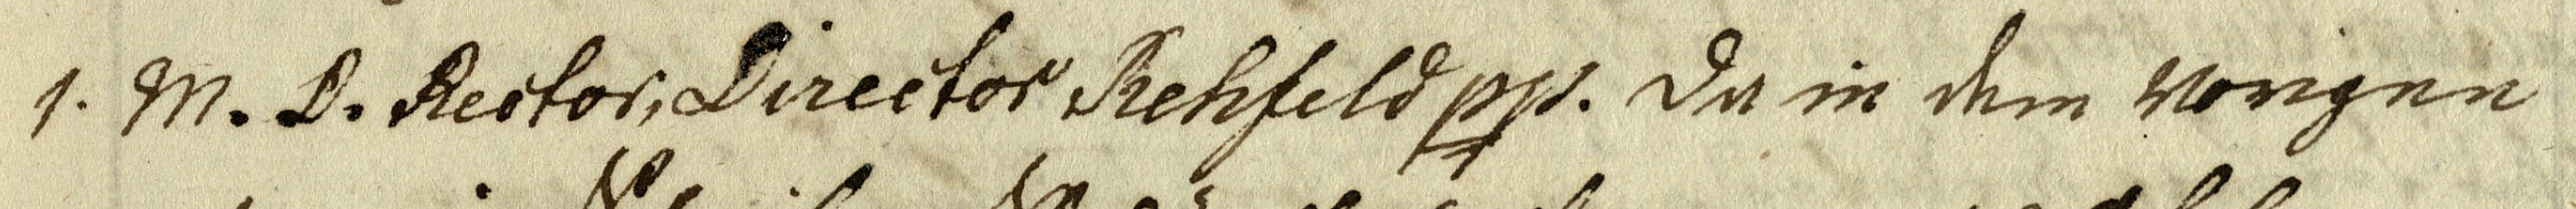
1. M. D. Rector, Director Rehfeld pp. da in dem vorigen
